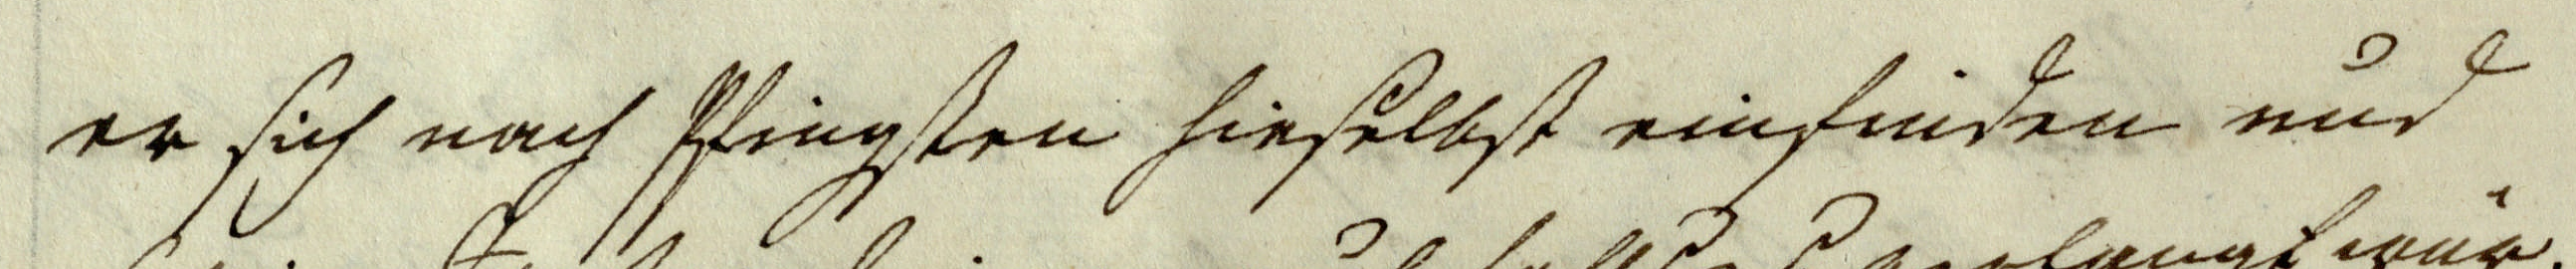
er sich nach Pfingsten hieselbst einfinden und
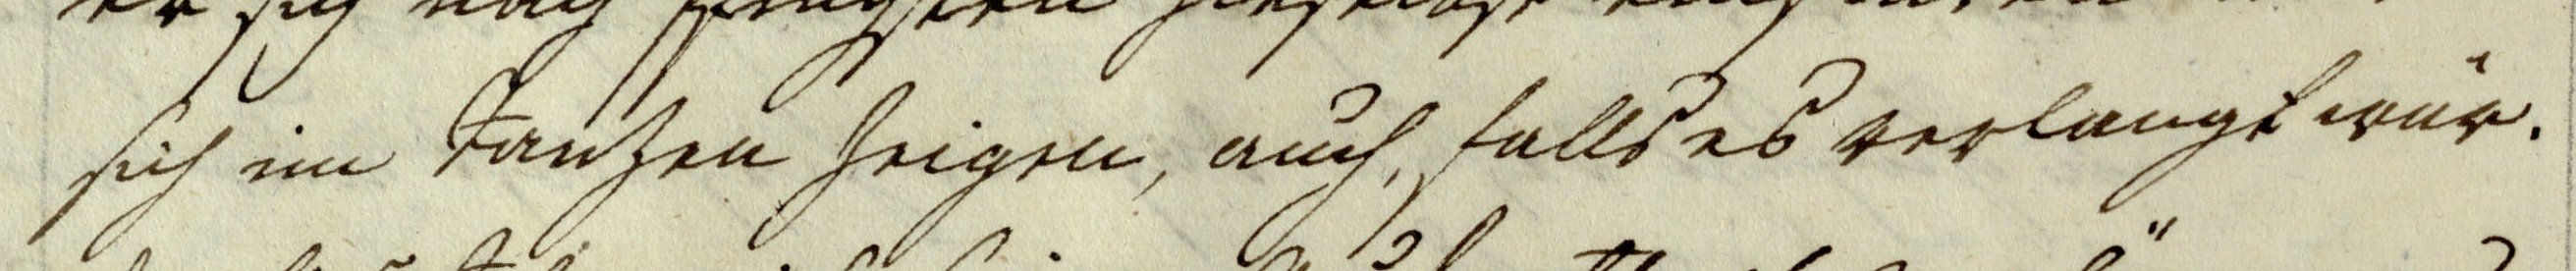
sich im Tanzen zeigen, auch, falls es verlangt wür¬
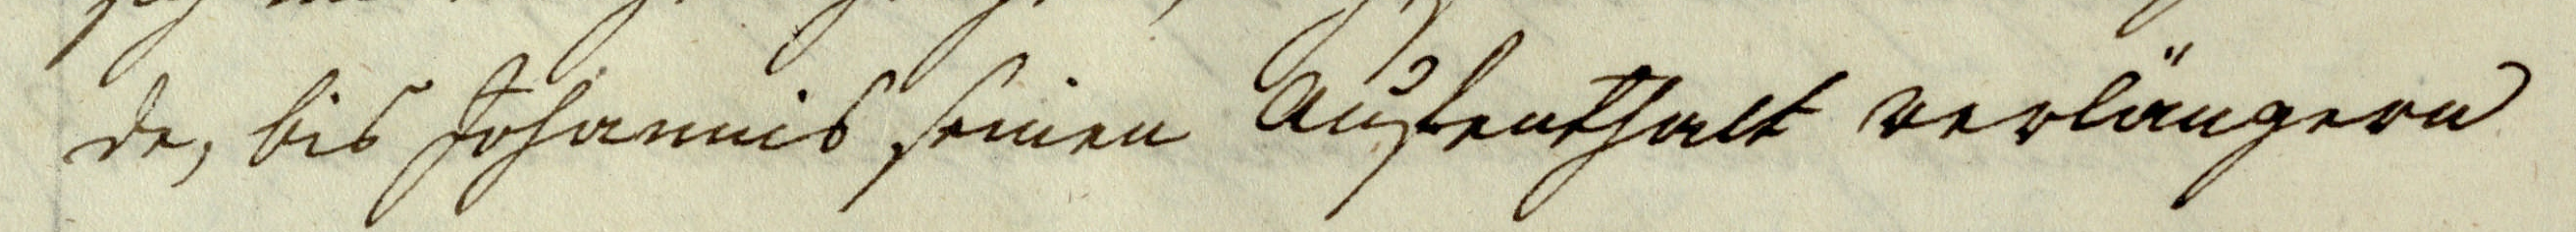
de, bis Johannis seinen Aufenthalt verlängern
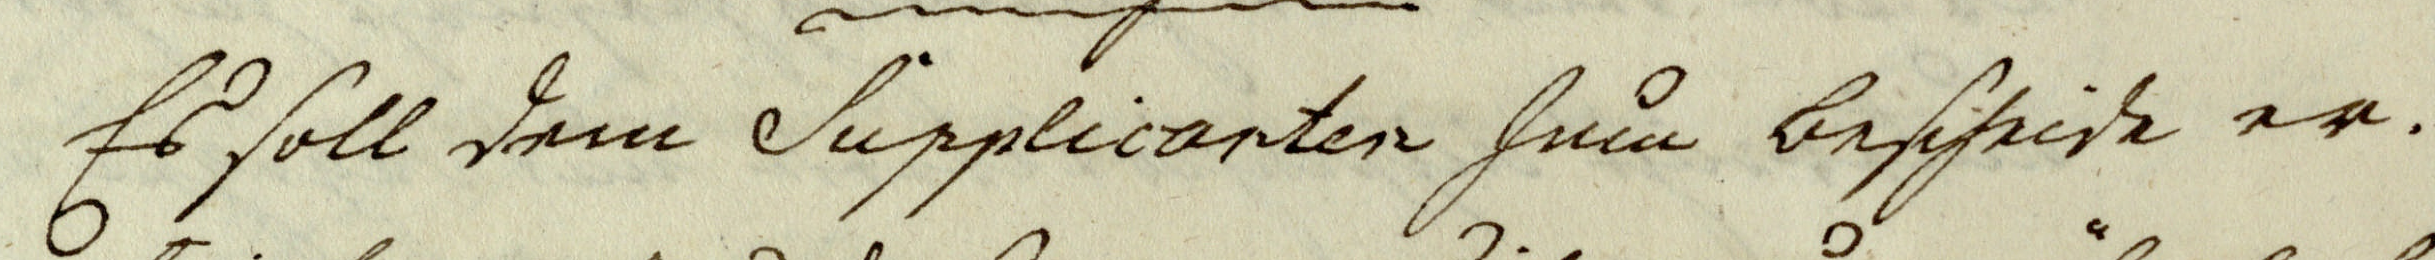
Es soll dem Supplicanten zum Bescheide er¬
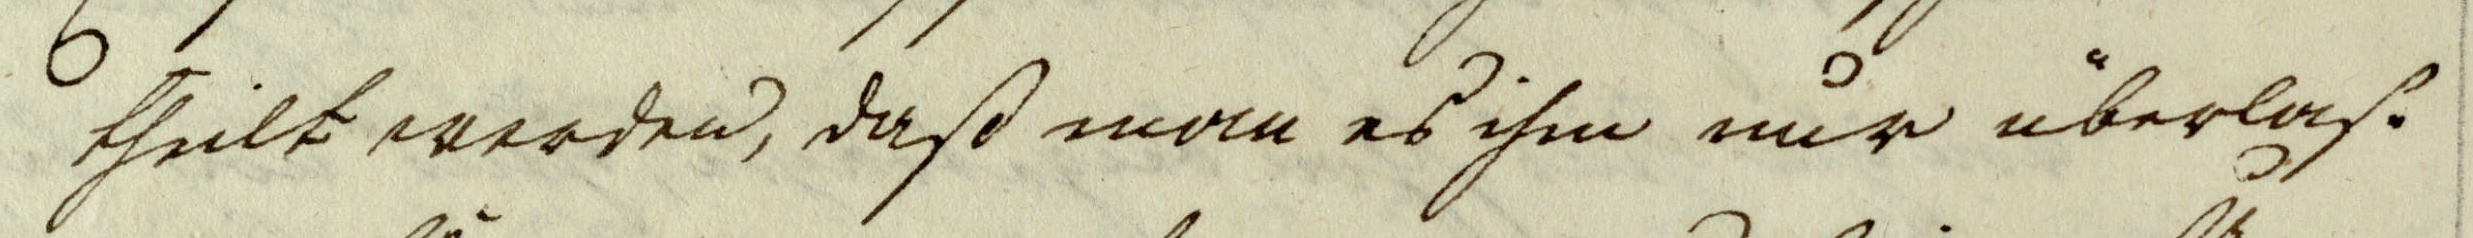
theilt werden, daß man es ihm nur überlas¬
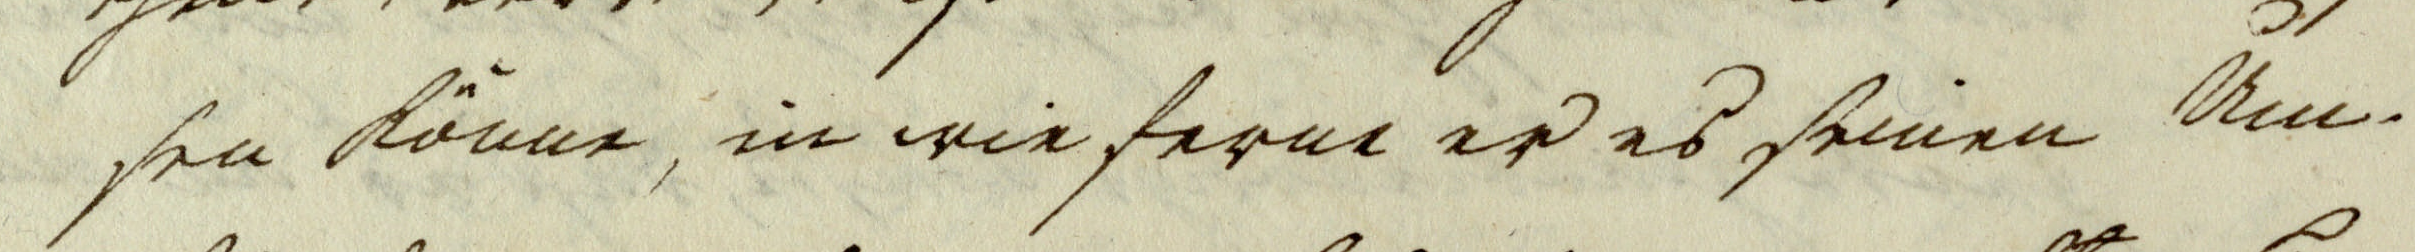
sen könne, in wie fern er es seinen Um¬
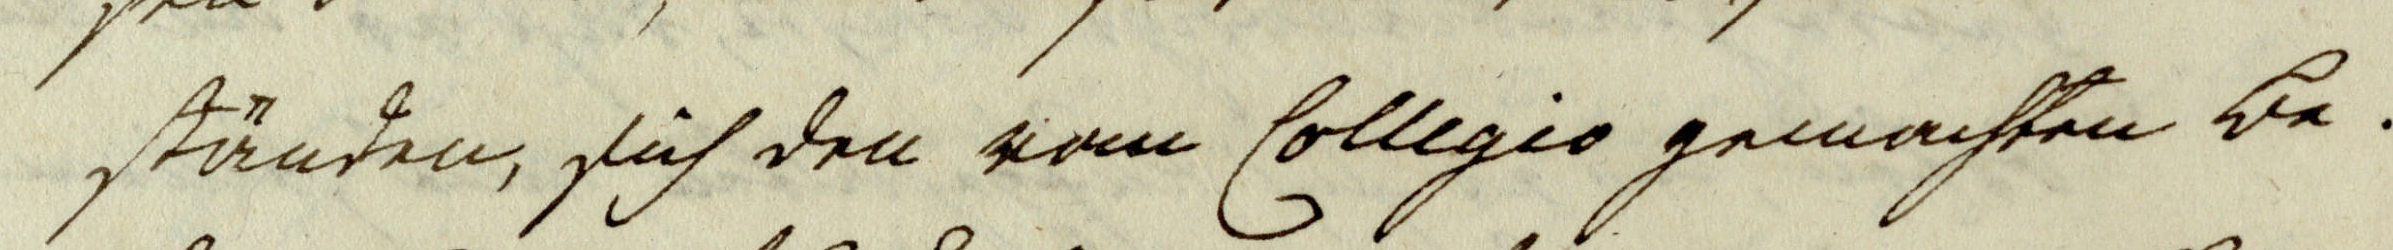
ständen, sich den vom Collegio gemachten Be¬
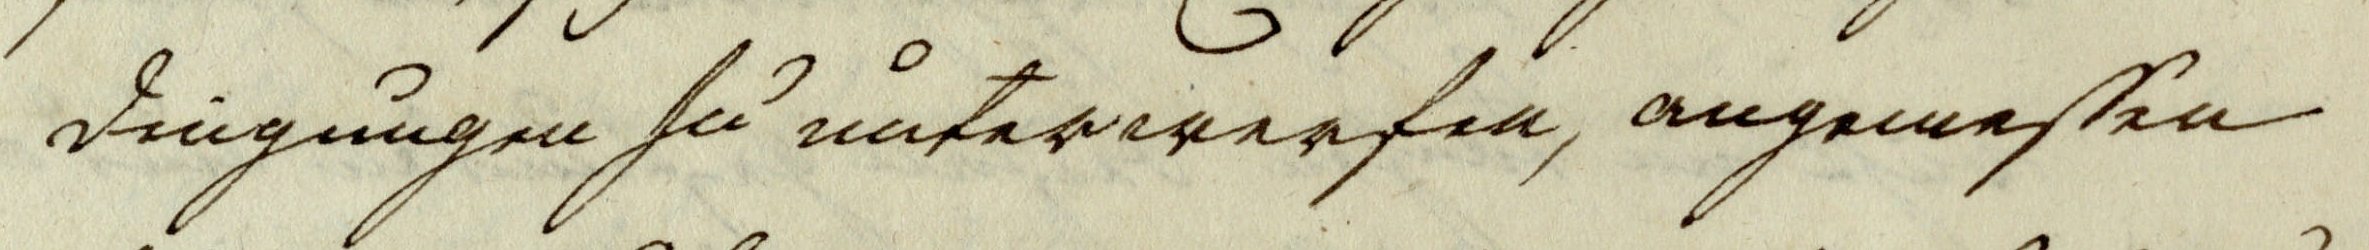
dingungen zu unterwerfen, angemessen
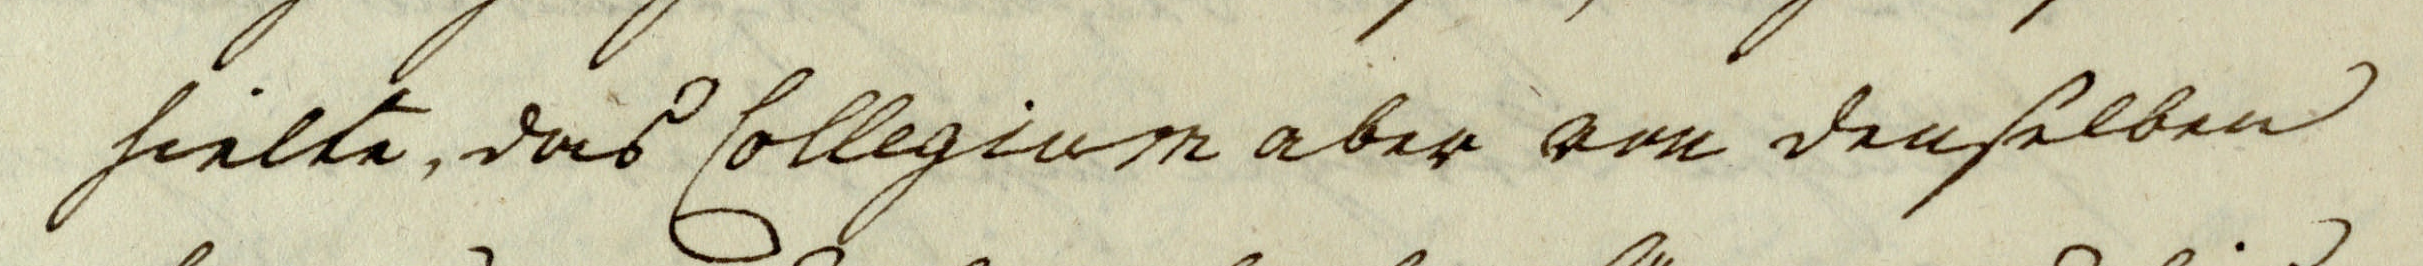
hielte, das Collegium aber von denselben
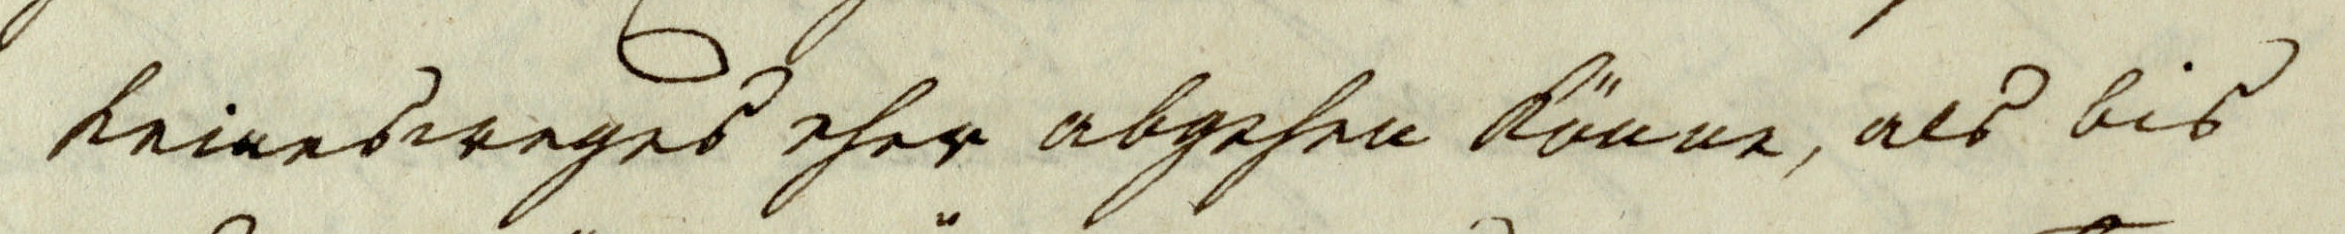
keinesweges eher abgehen könne, als bis
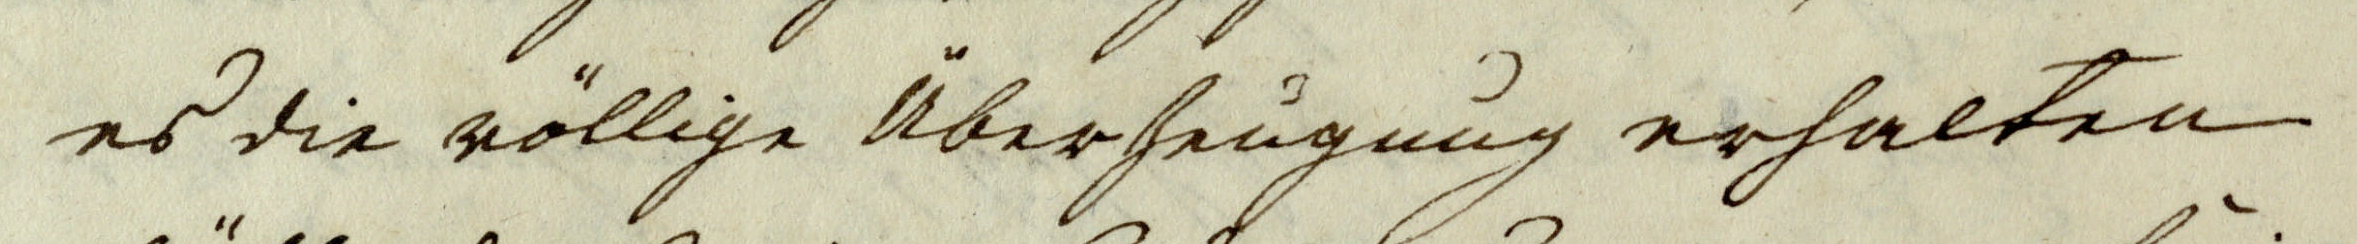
es die völlige Überzeugung erhalten
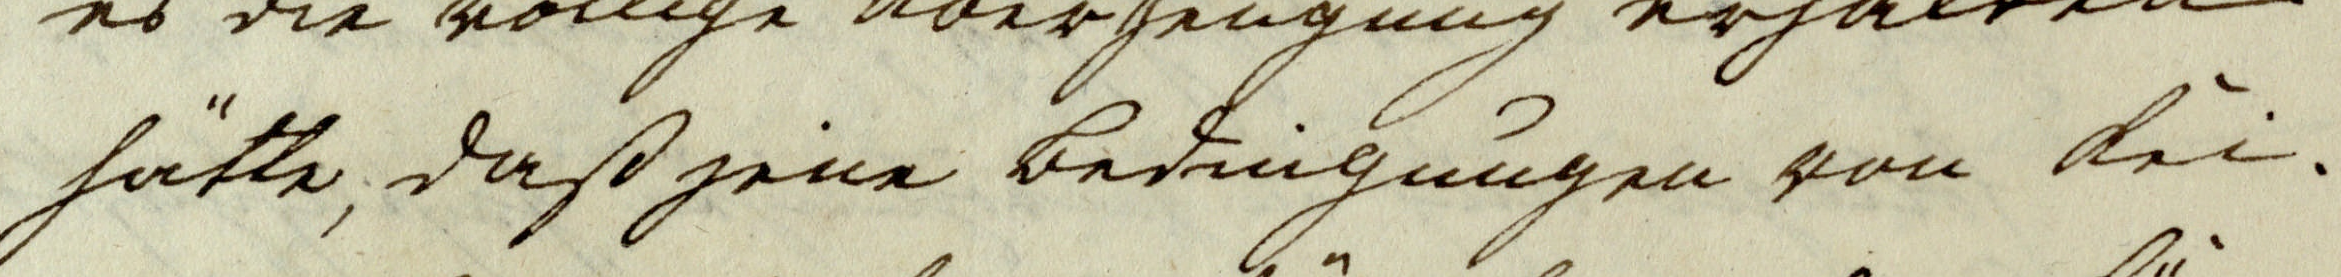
hätte, daß seine Bedingungen von kei¬
